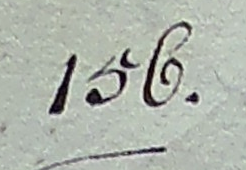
156.
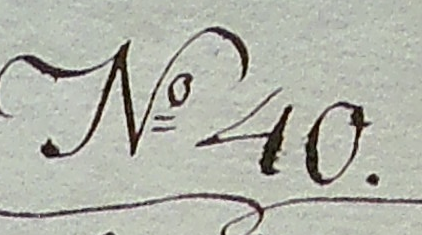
No͇ 40.
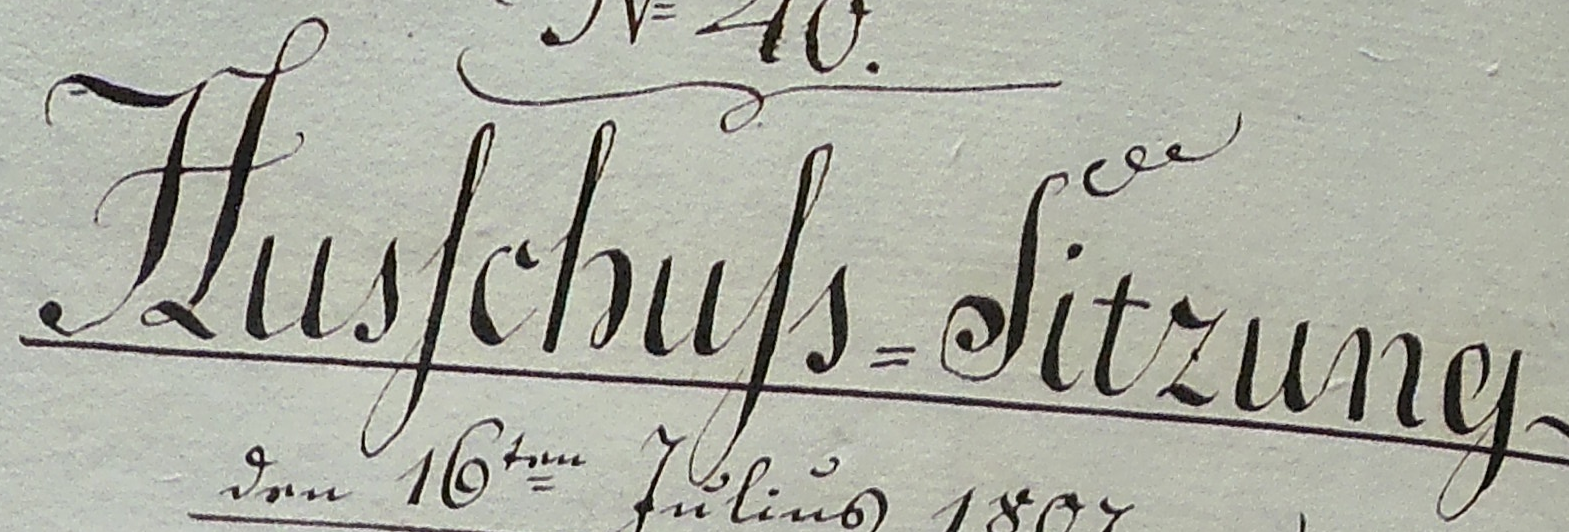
Ausschuss‗Sitzung
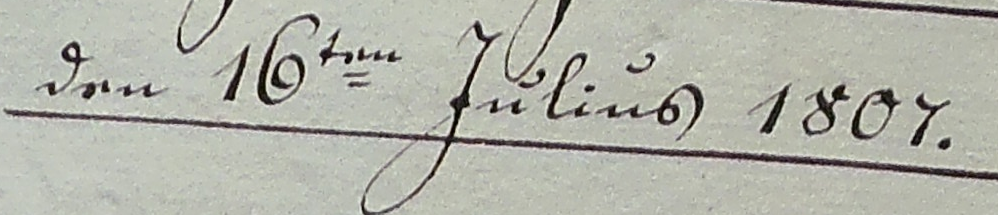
den 16te͇n Julius 1807.
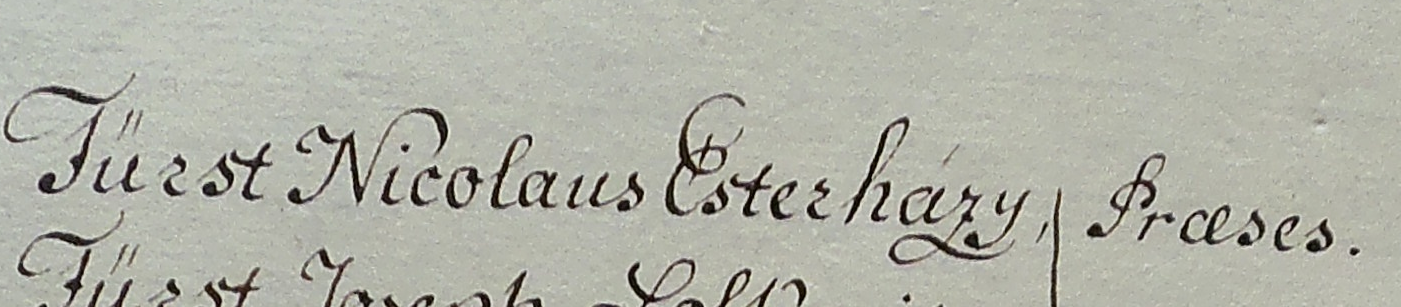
Fürst Nicolaus Esterházy, Præses.
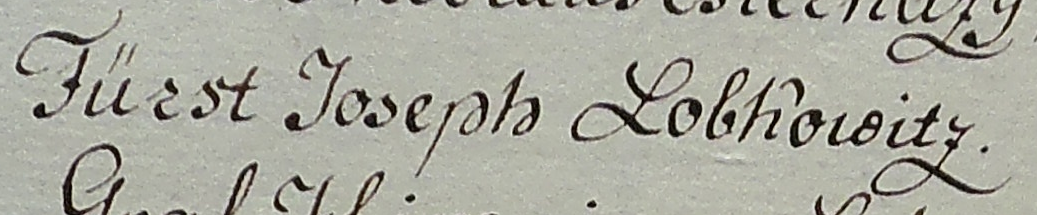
Fürst Joseph Lobkowitz.
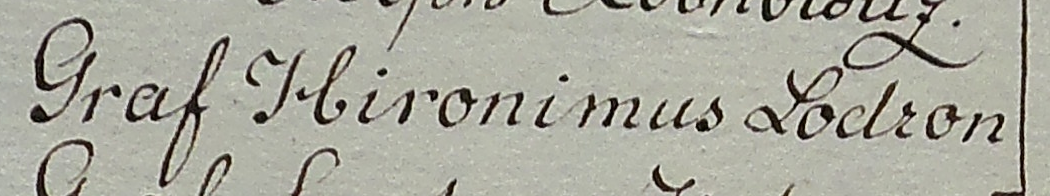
Graf Hironimus Lodron
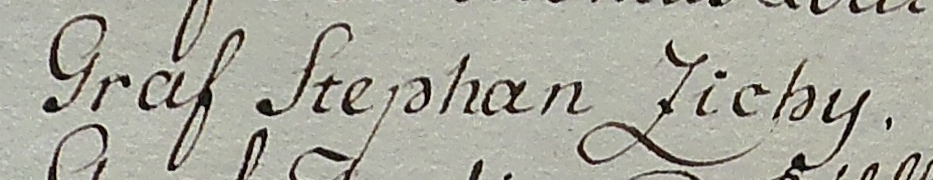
Graf Stephan Zichy.
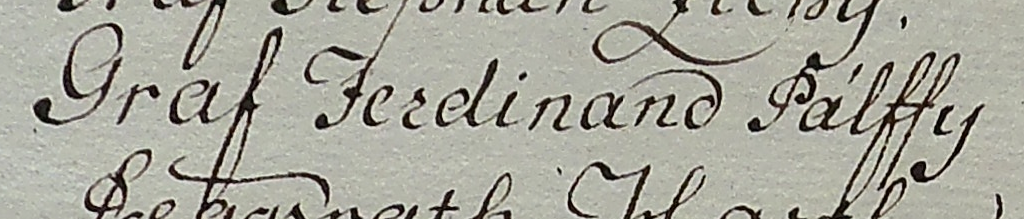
Graf Ferdinand Pálffy
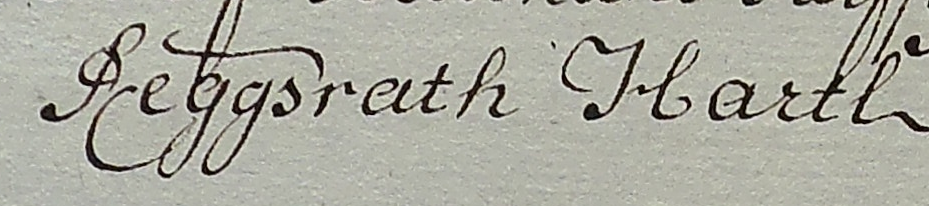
Reg͞gsrath Hartl
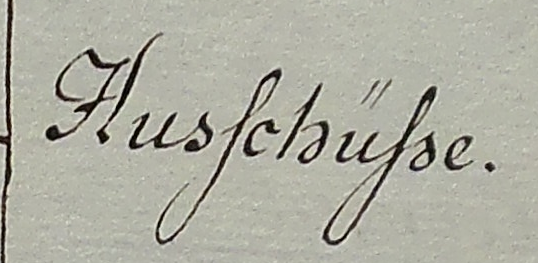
Ausschüsse.
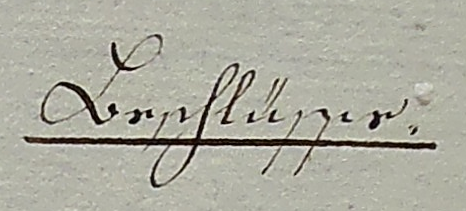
Beschlüsse.
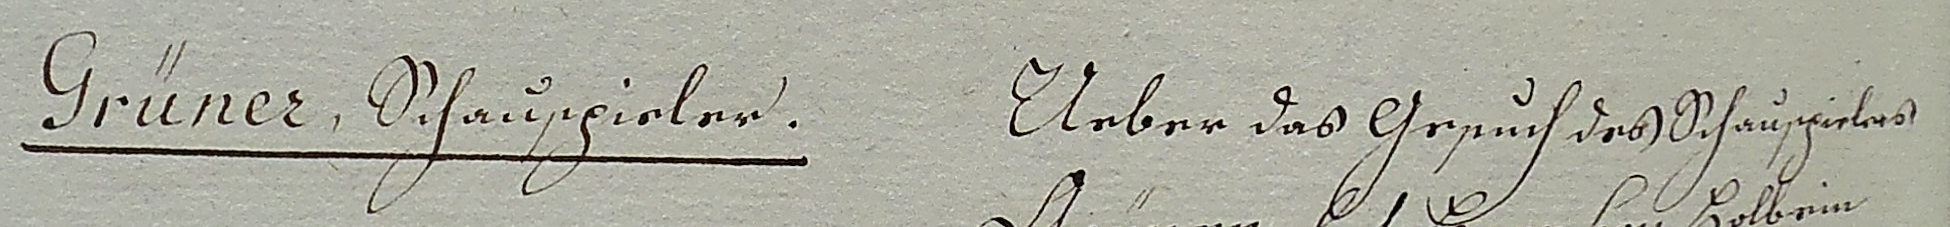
Grüner, Schauspieler. Ueber das Gesuch des Schauspielers
